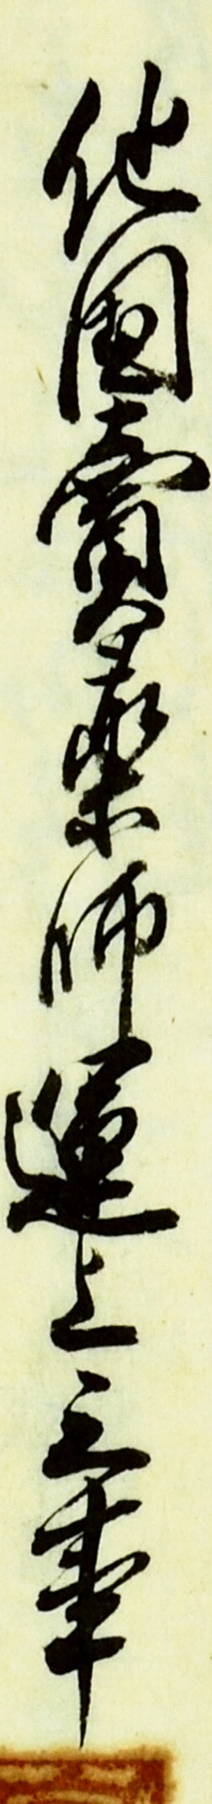他国売薬師運上之事
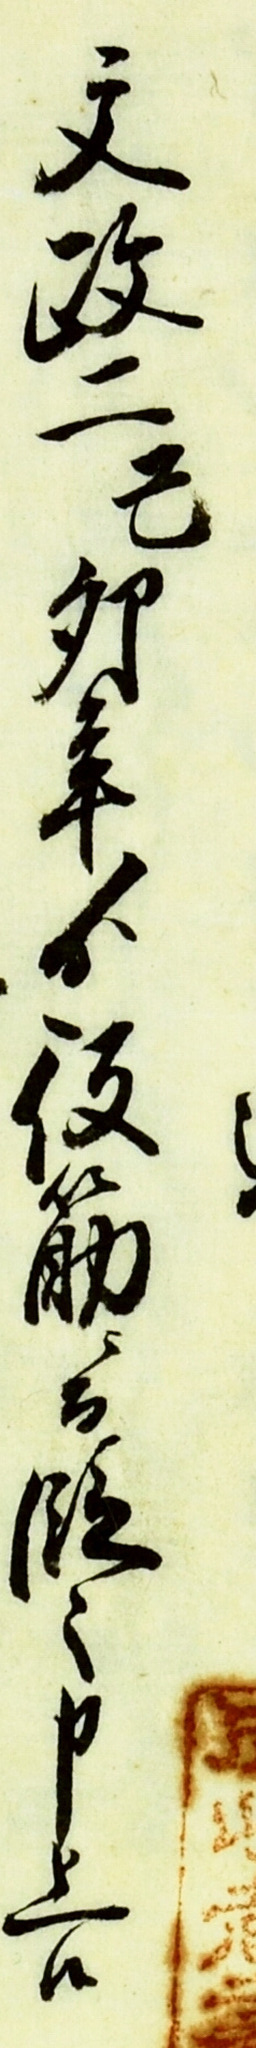文政二己卯年ゟ役筋ニ而段々申上候
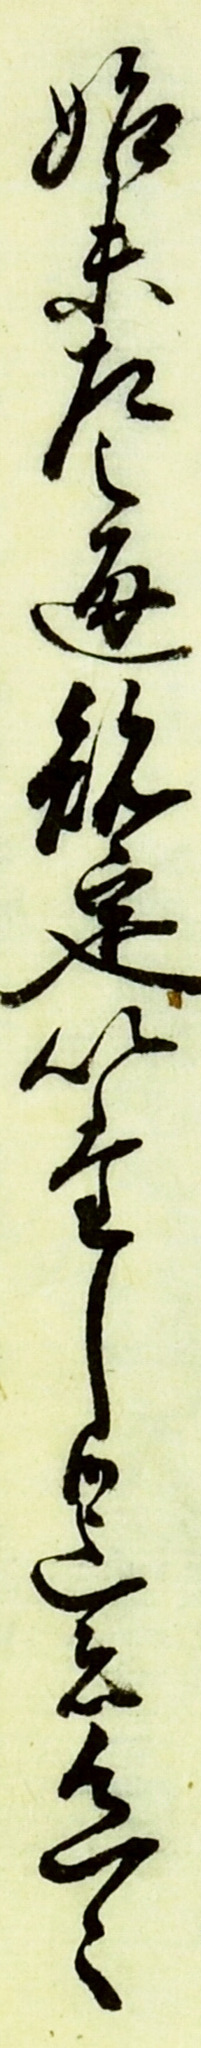始末左之通規定いたし候迄者追々
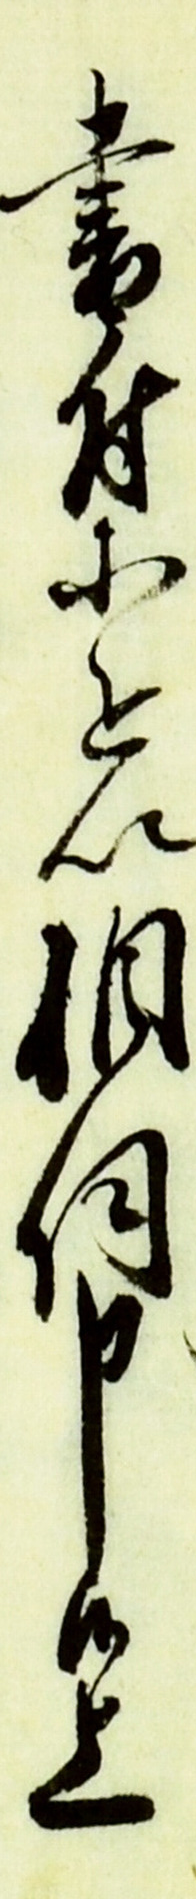書付等を以相伺申候上
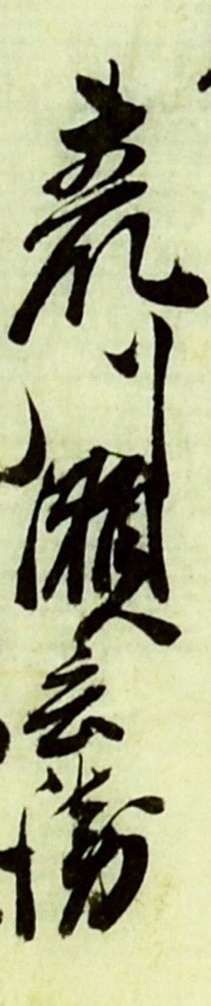荒川瀬兵衛
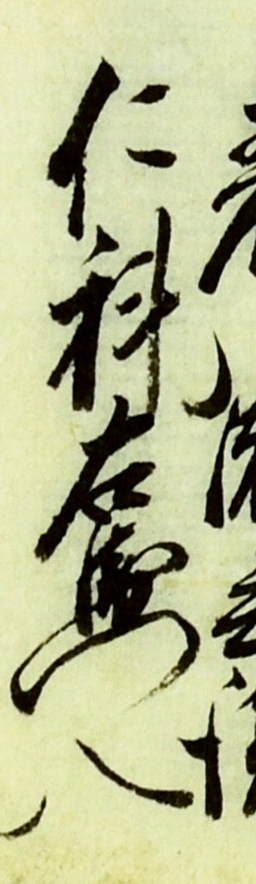仁科右衛門八

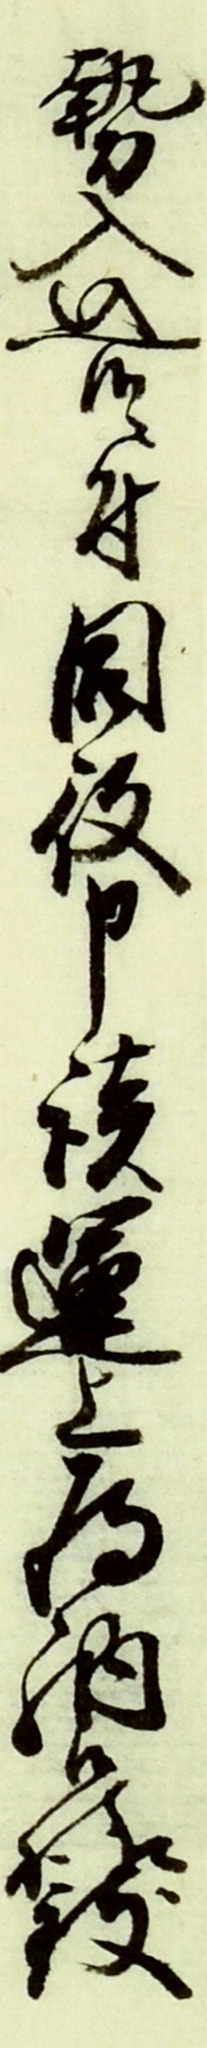勢入込候ニ付同役申談運上為納候様致
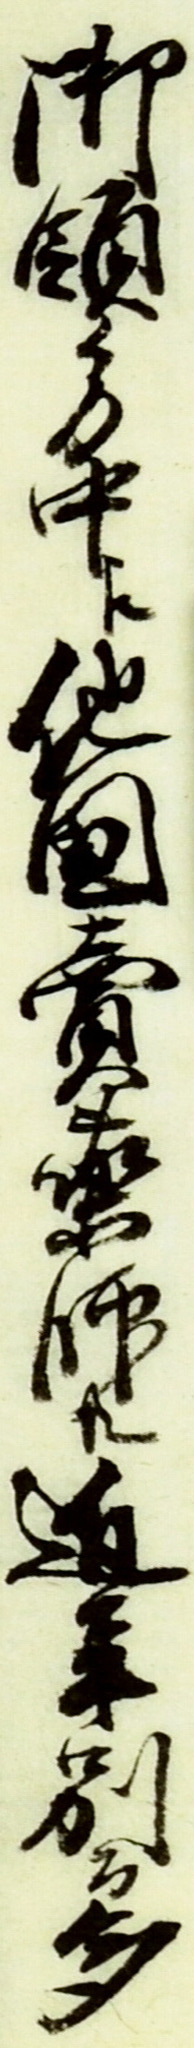御領可中江他国売薬師共近年別而多
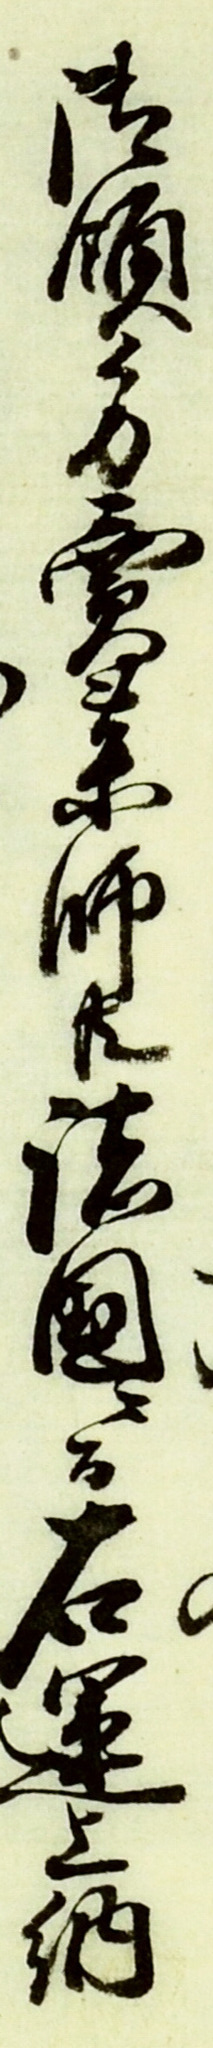御領方売薬師共諸国ニ而右運上納
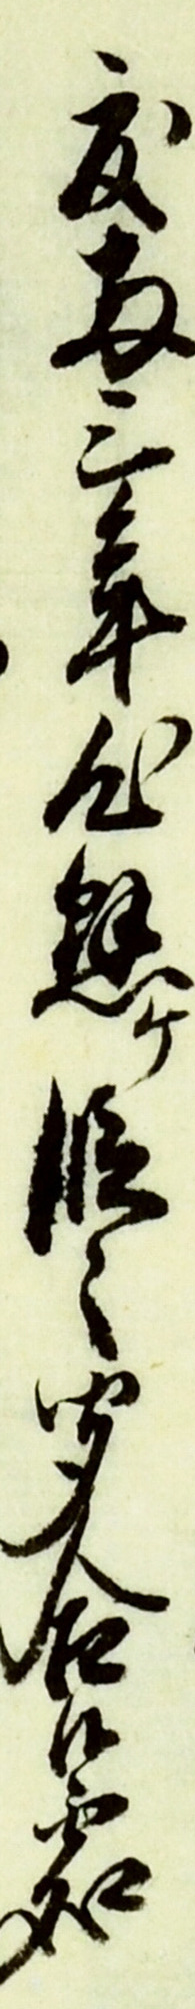度両三年心懸ヶ段々聞合候諸処
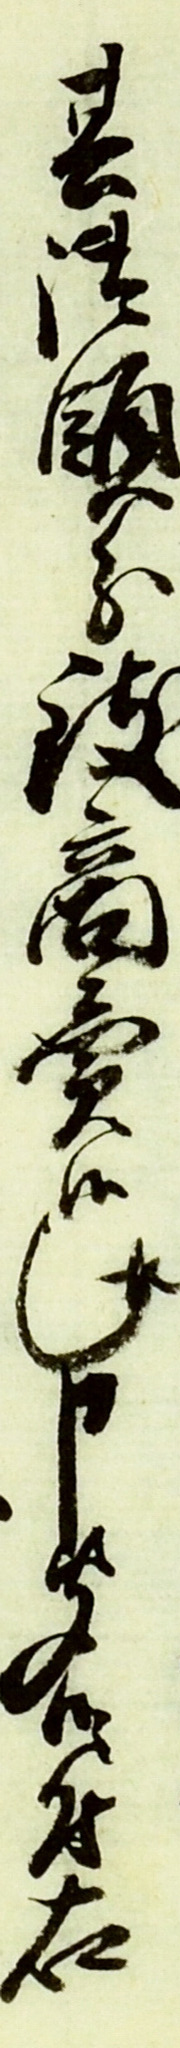其御領分致商売候趣申聞候ニ付右
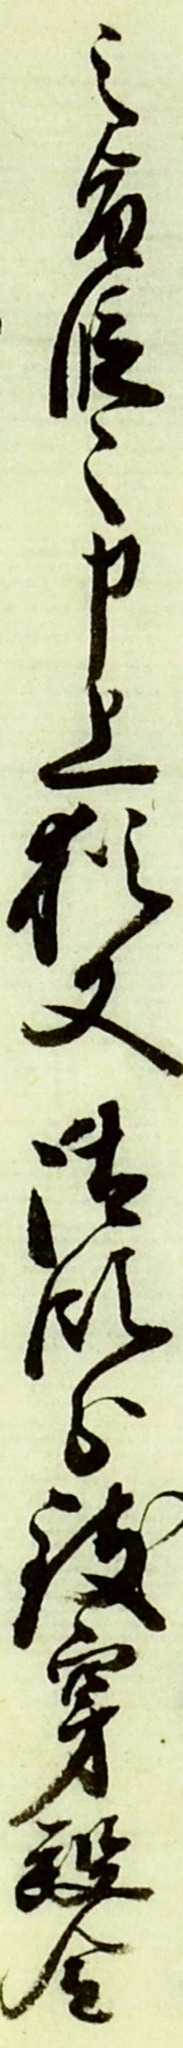之旨段々申上猶又御領分致穿鑿
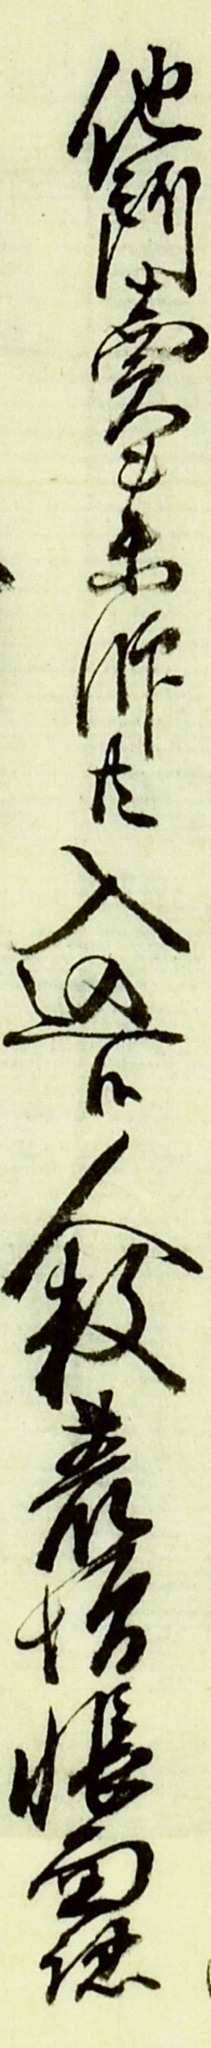他所売薬師共入込候人数荒増帳面認
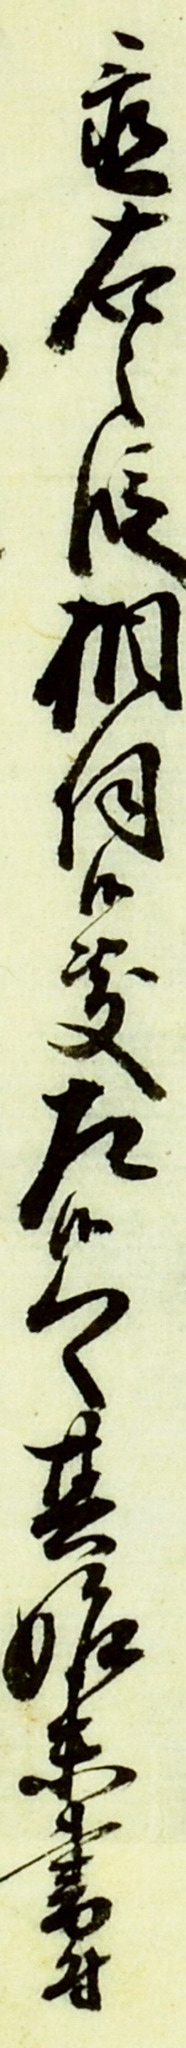置右之段相伺候処左候ハヽ其始末書付
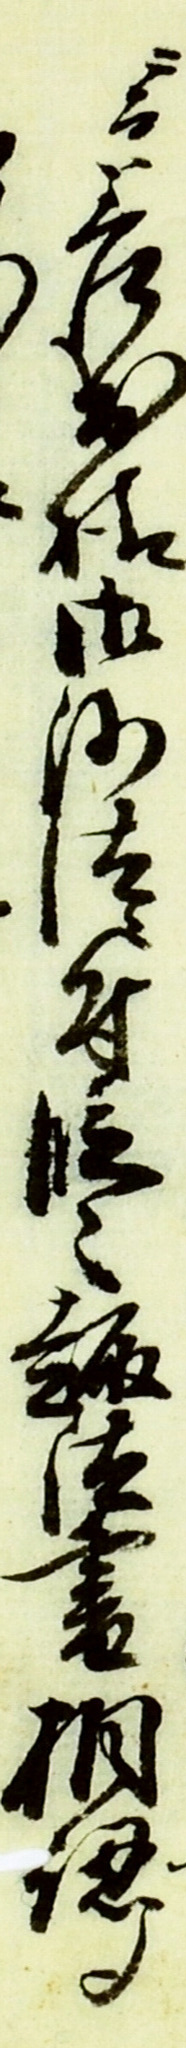ニ而差出様御沙汰ニ付段々趣法書相認メ
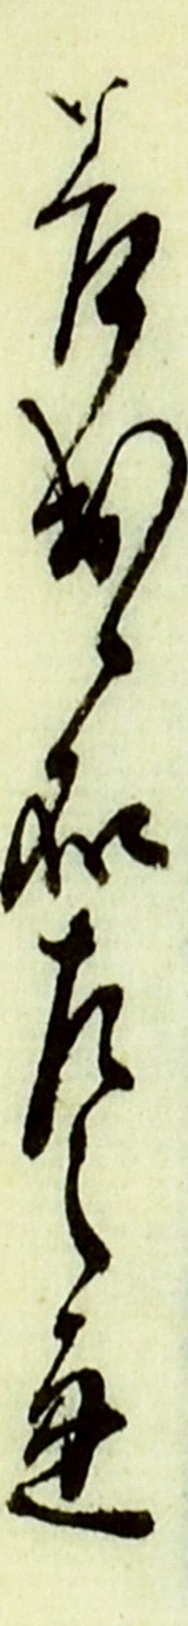差出候処左之通
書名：他国賣薬師運上之事
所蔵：伊那市立高遠町図書館・合同会社AMANE
